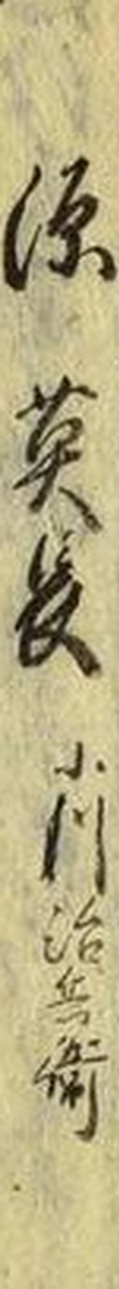源英長小川治兵衛
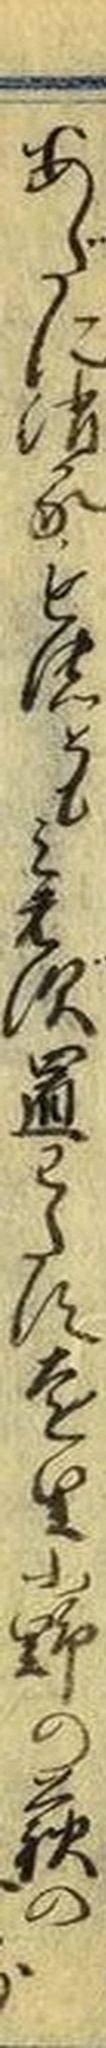あだに消るものとものみえず置わたすをり小野の萩の上露
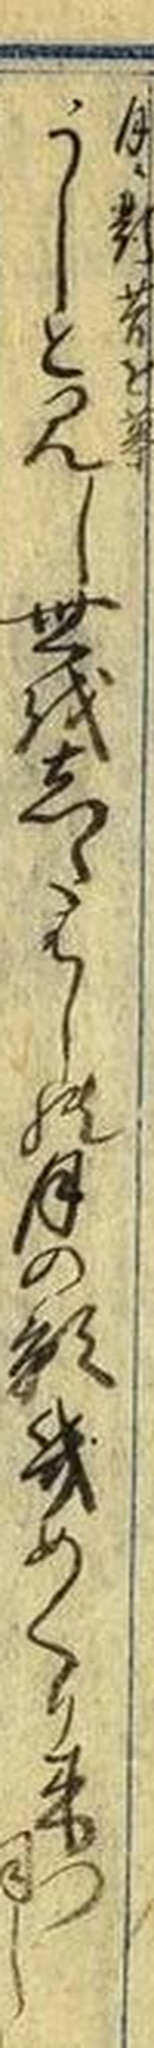うしと見し世をしたはしの月の影幾めくり来つほし光に
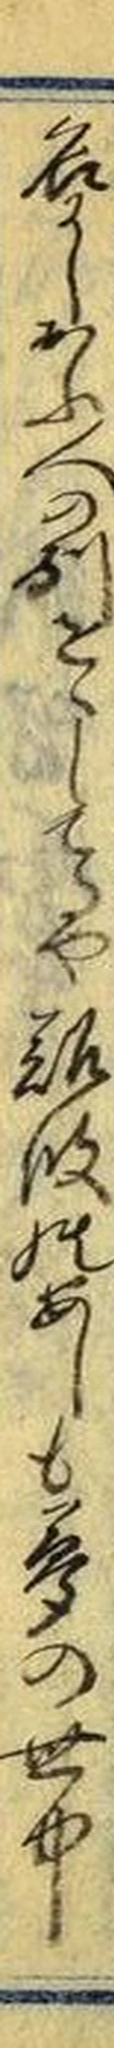名にしおふ人の別をゝしてるや難波のあしも夢の世中

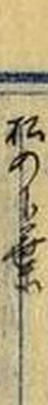松の下葉
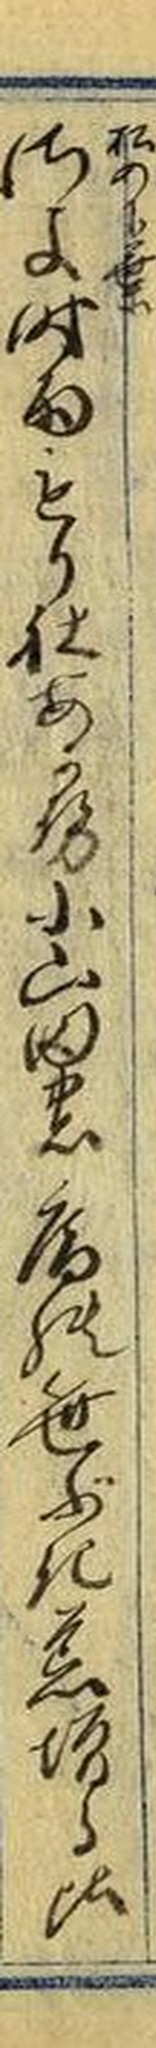さよ時雨もり社あかせ小山田の房の笹ぶき荒増る比
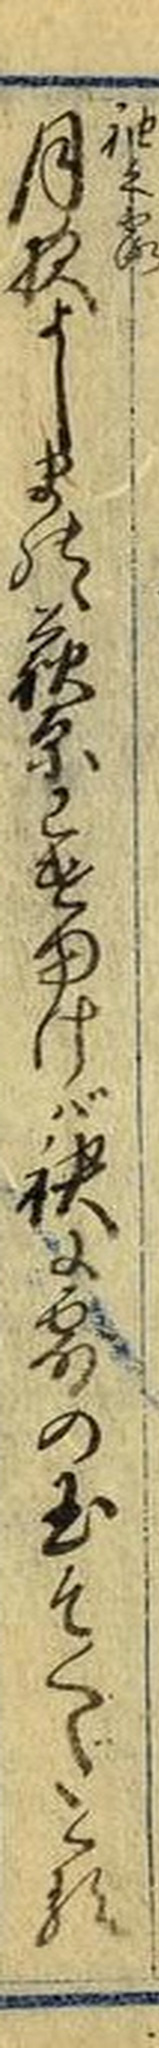月夜よしまのゝ萩原わけゆけば袂に露の玉そくだくる
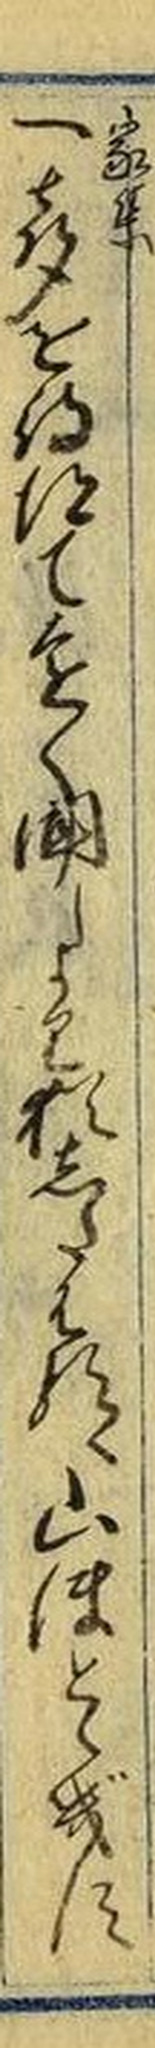一声を待得て遠く聞しより猶したはるゝ山ほとゝぎす
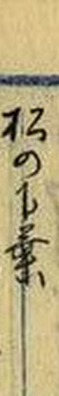松の下葉
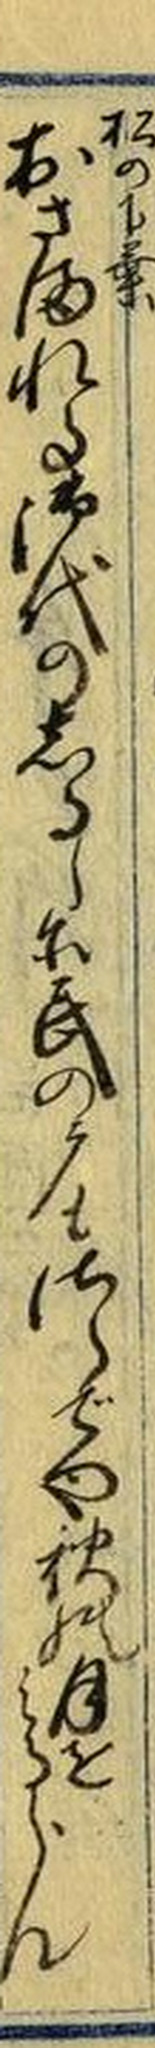おさまれる御代のしるしに民の戸もさらでや秋の月をみるらん
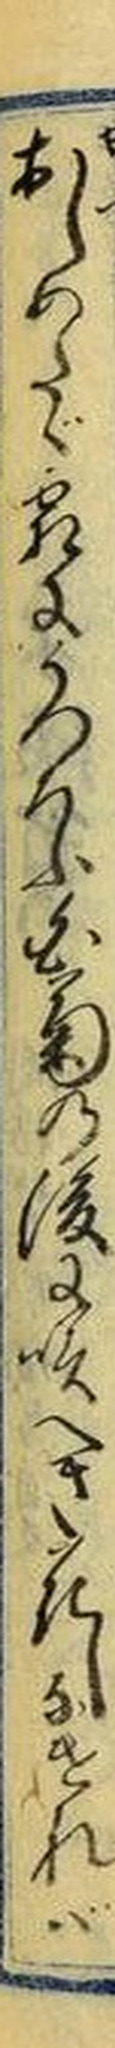おしめたゞ霜にうつろふ色菊の後に咲へき花しなければ
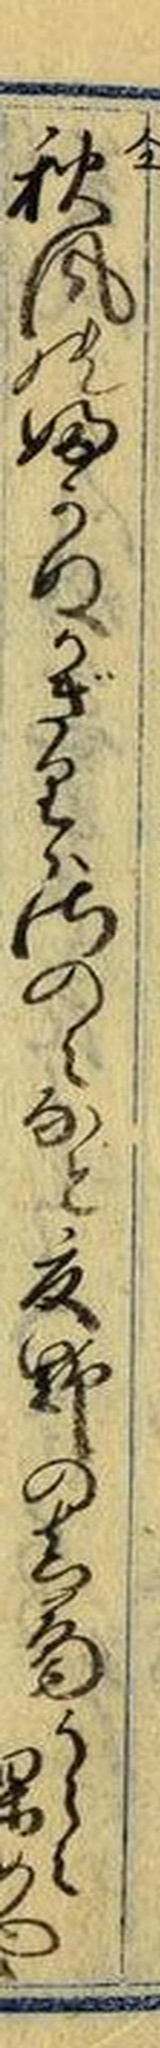秋風のふかぬかぎりはさのみなと夏野の真葛うらみ果めや
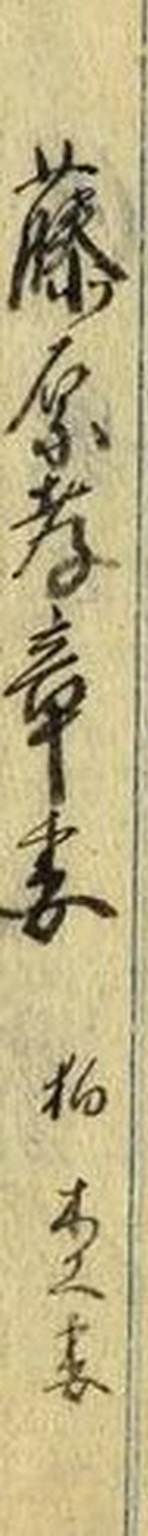藤原孝章妻狛木工妻
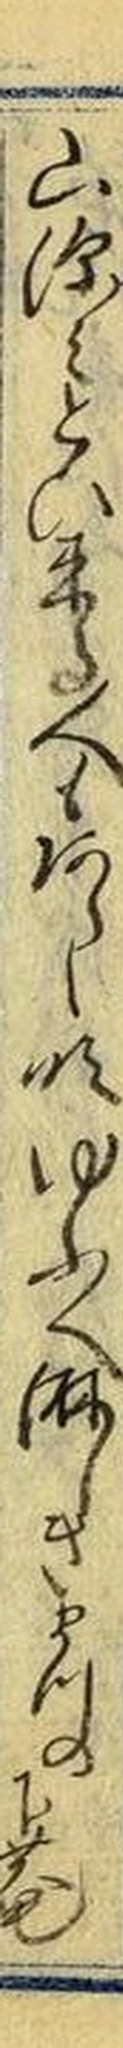山涼みとひ来る人もあらし波ゆふへ淋しきまつの下菴
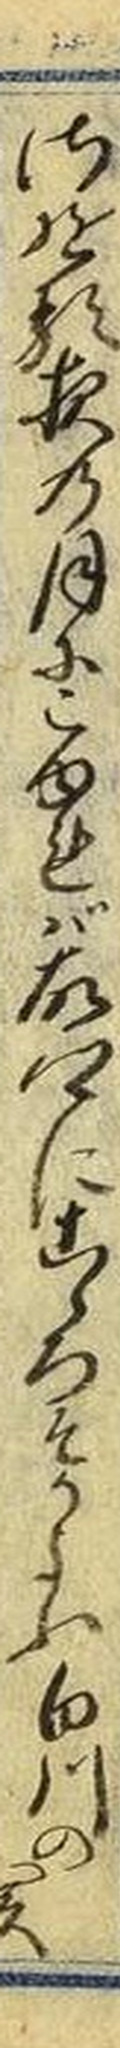さゆる夜の月にこゆれば故郷にこゝろそかよふ白川の関
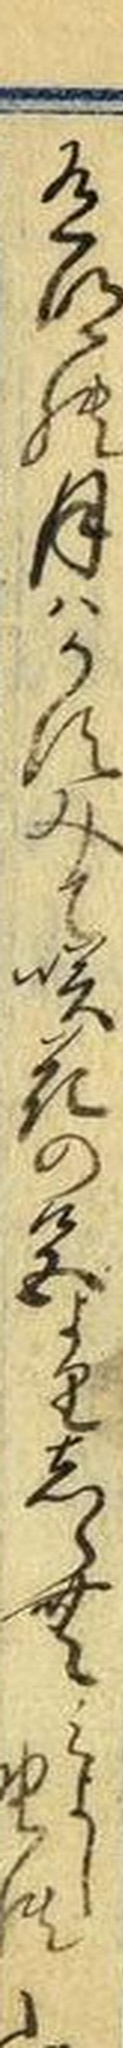有明の月はかすみて咲花の色よりしらむみよしのの山
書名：温古集 三巻
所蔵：福井県文書館 Fukui Prefectural Archives
